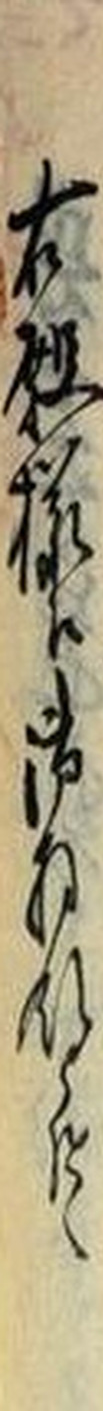右殿様江御拝領被遊候
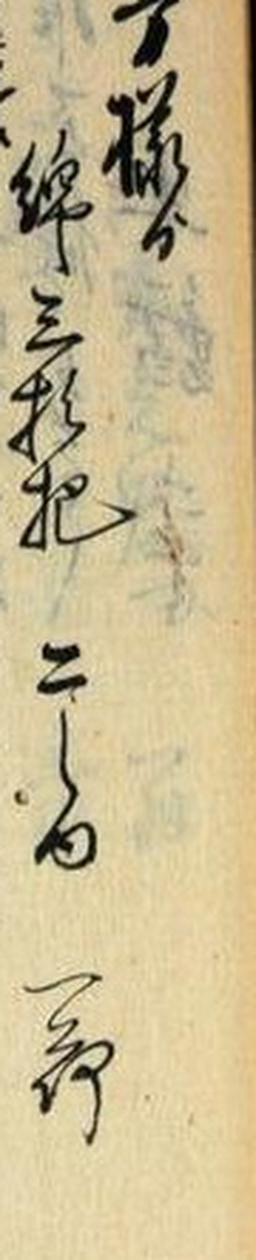綿三拾把ニ之内一荷
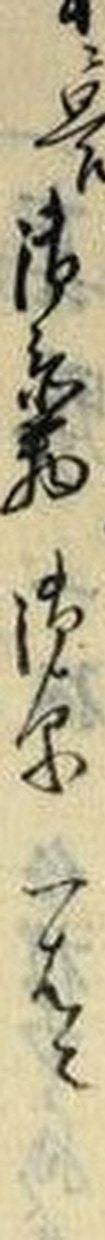御置物御卓一はこ
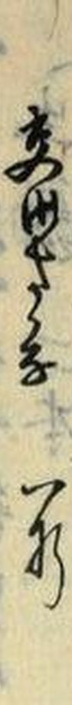交御さかな一折
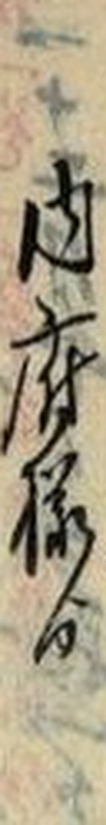内府様ゟ
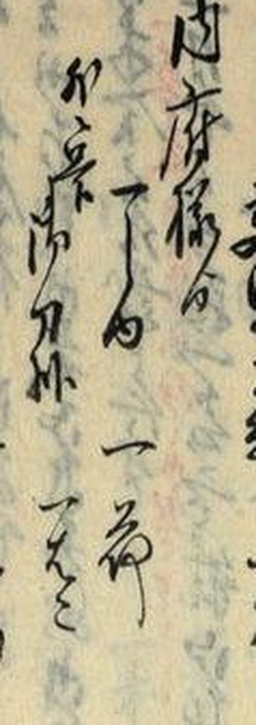一之内一荷
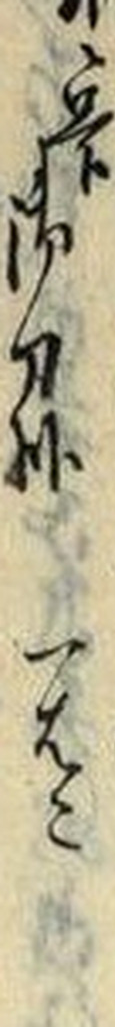御刀掛一はこ
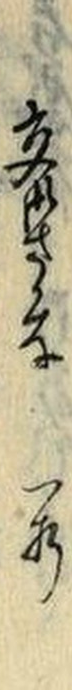交御さかな一折
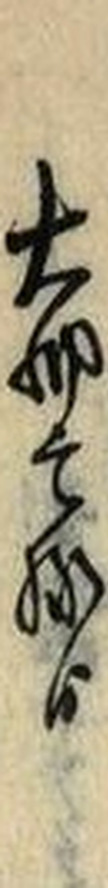大納言様ゟ
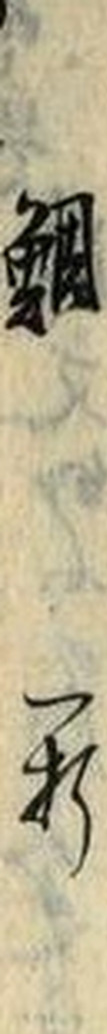鯛一折
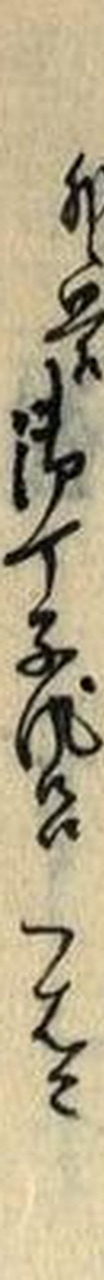御丁子風呂一はこ
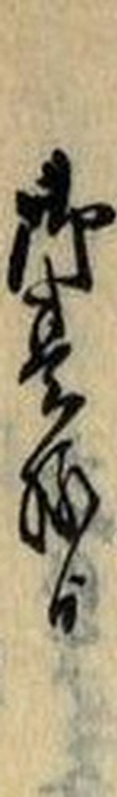御台様ゟ
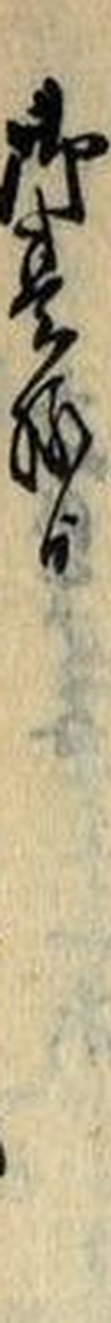御台様ゟ
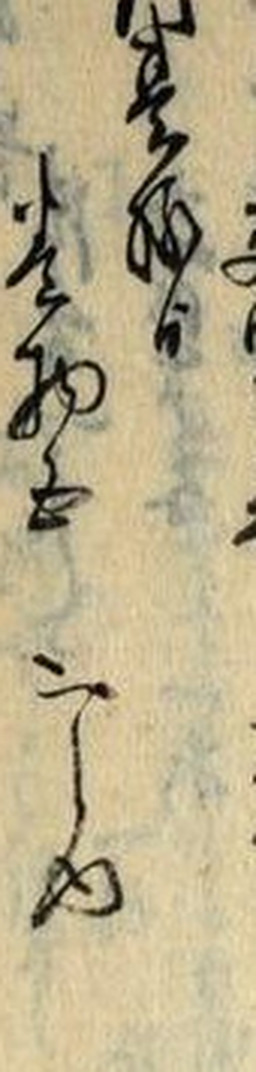巻物五ニ之内

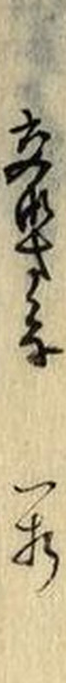交御さかな一折
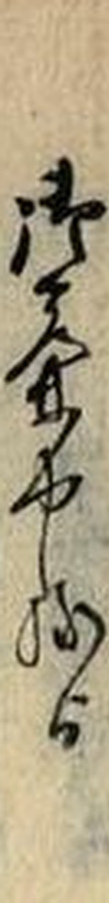御簾中様ゟ
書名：少傅日録抄（斉承付側向頭取日記、在府）
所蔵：福井県文書館 Fukui Prefectural Archives
